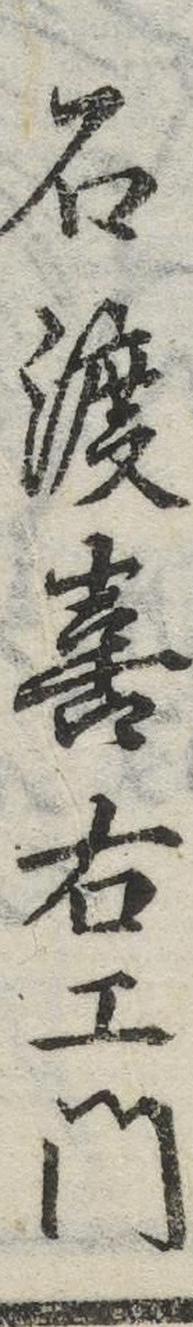石渡喜右エ門
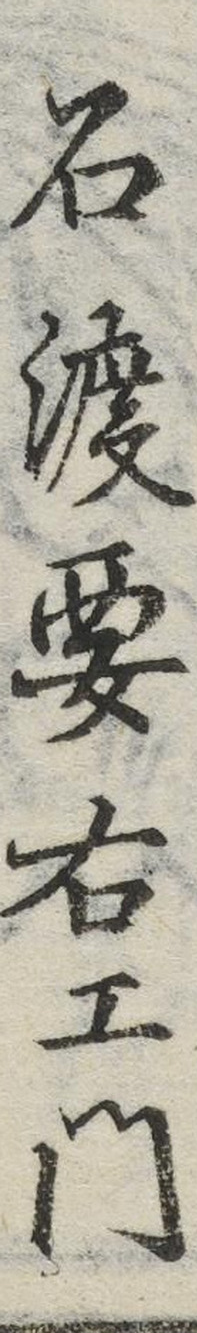石渡要右エ門
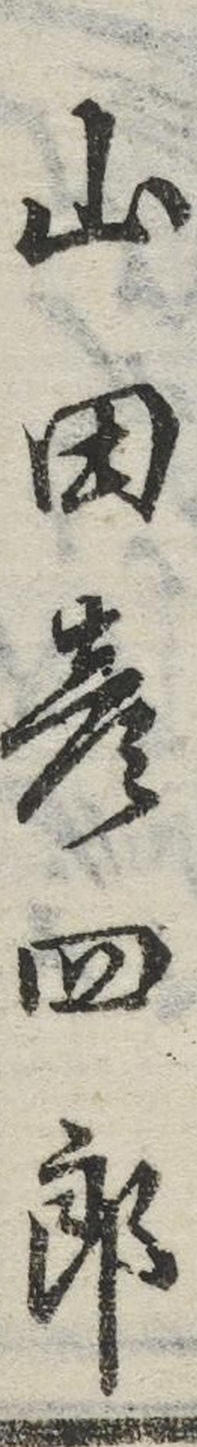山田彦四郎
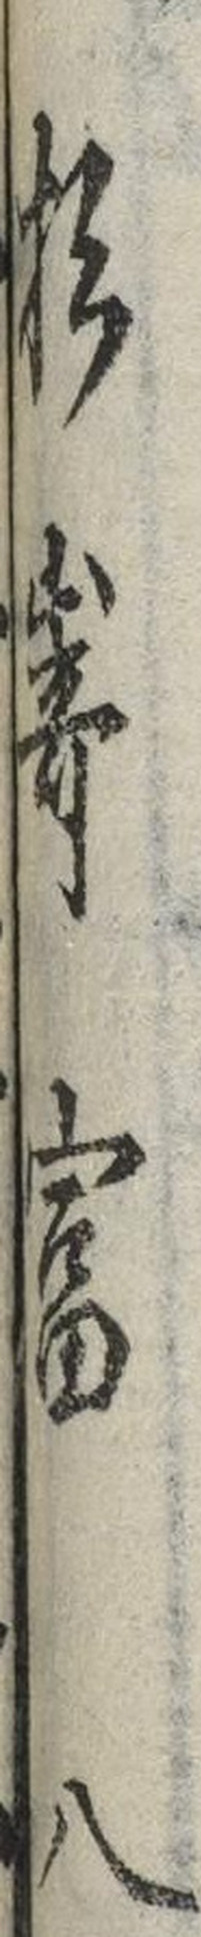松嵜富八
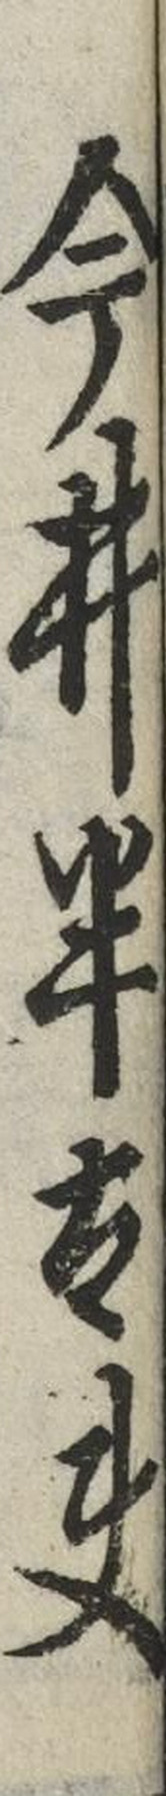今井半太夫
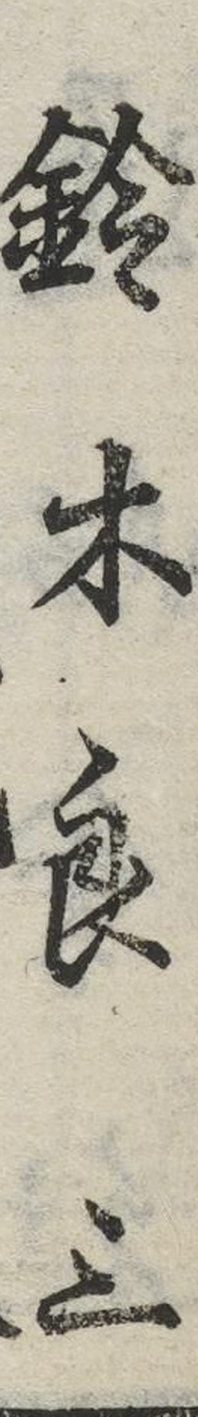鈴木良三
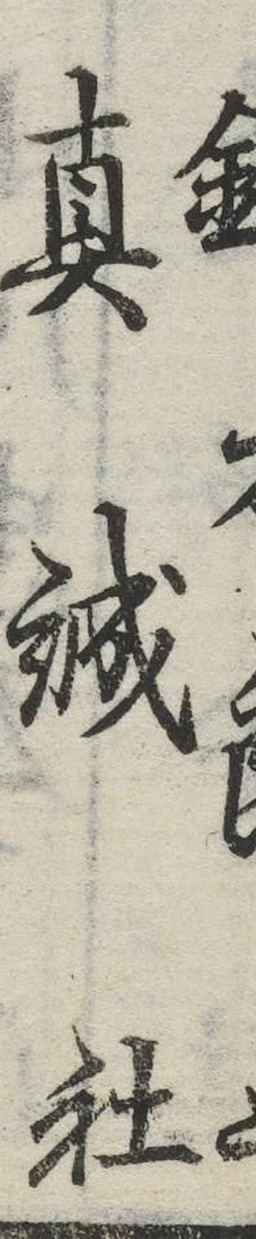真誠社
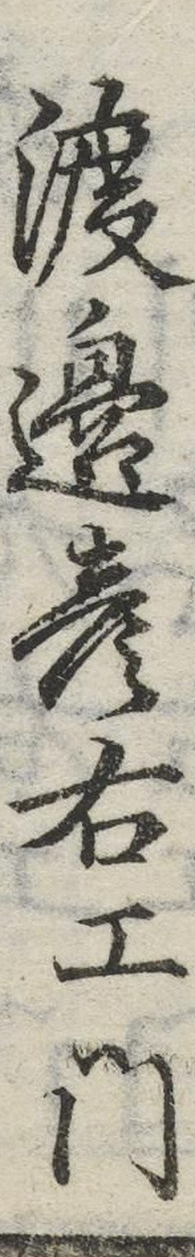渡邉彦右エ門
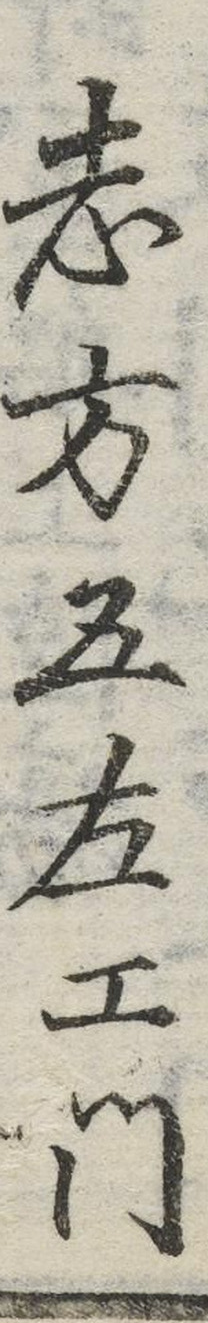志方五左エ門
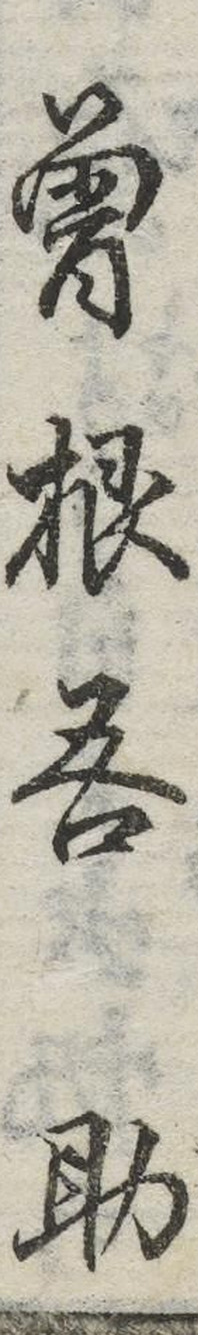曽根吾助
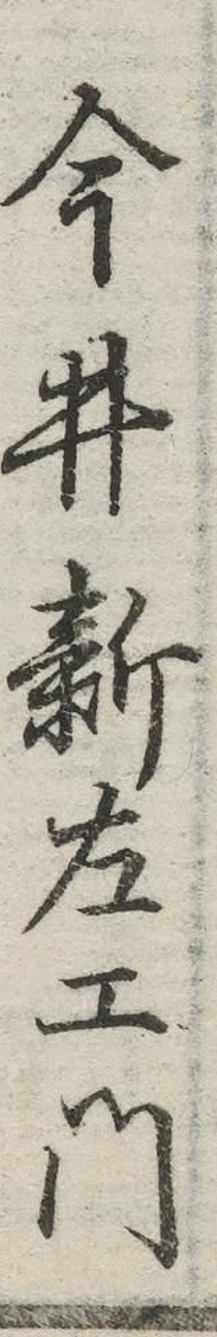今井新左エ門
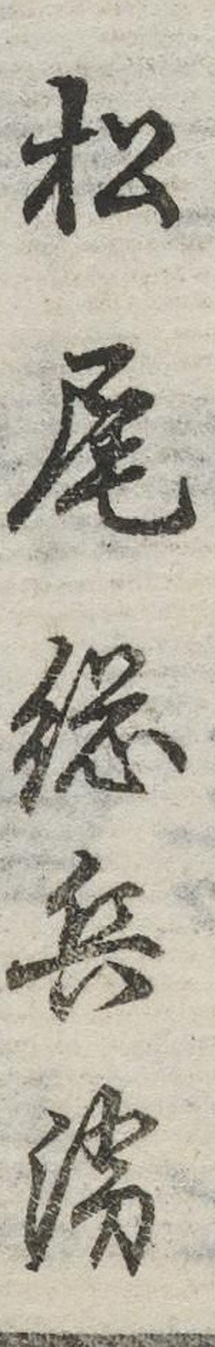松尾総兵衛
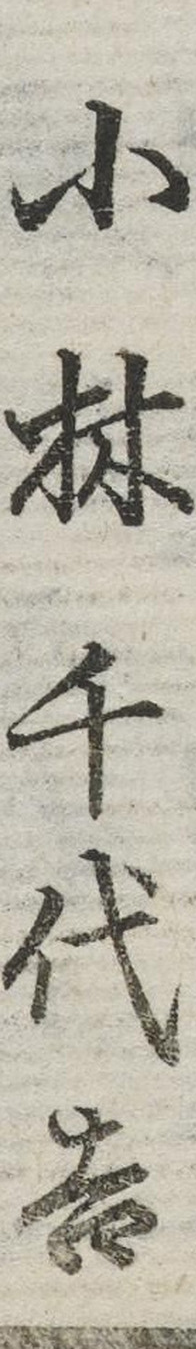小林千代吉
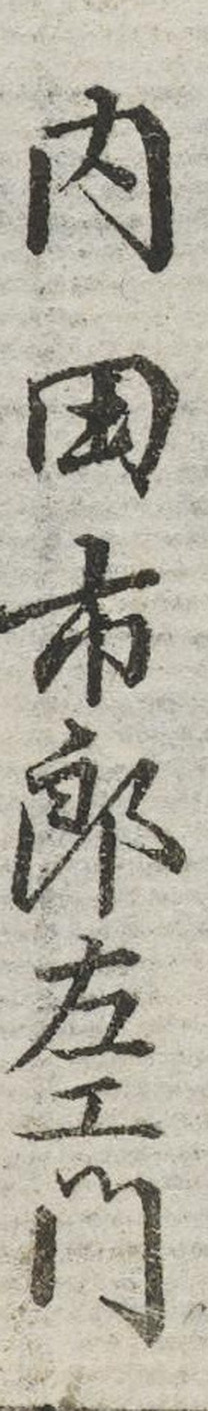内田市郎左エ門
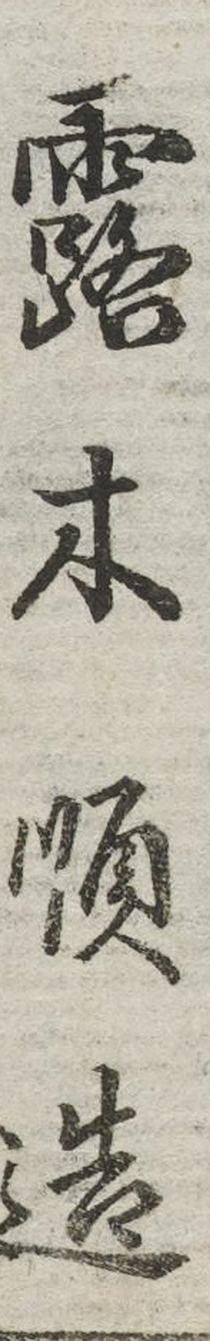露木順造
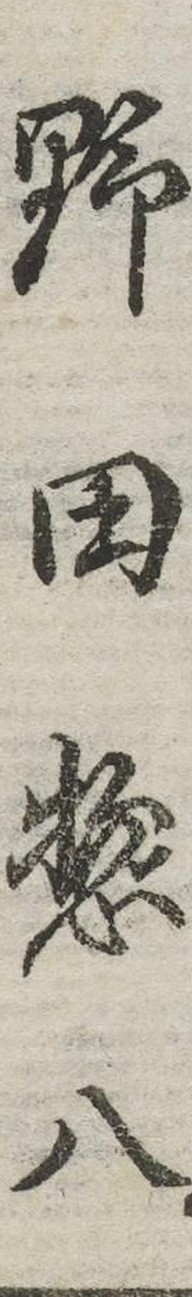野田惣八
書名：諸國温泉遊覽記　全
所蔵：東京大学地震研究所図書室 Earthquake Research Institute Library, The University of Tokyo, JAPAN
